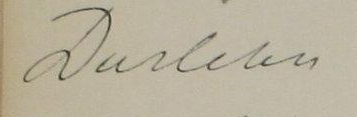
Darlehn
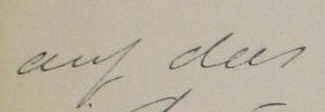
auf das
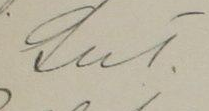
Gut
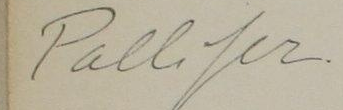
Pallifer
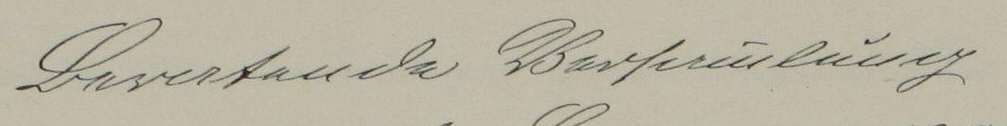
Beratende Versammlung
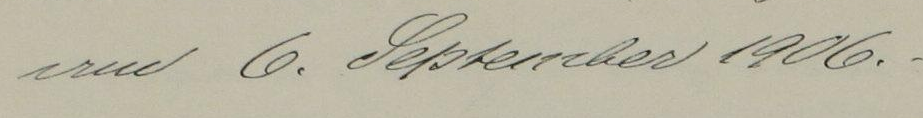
am 6. September 1906.
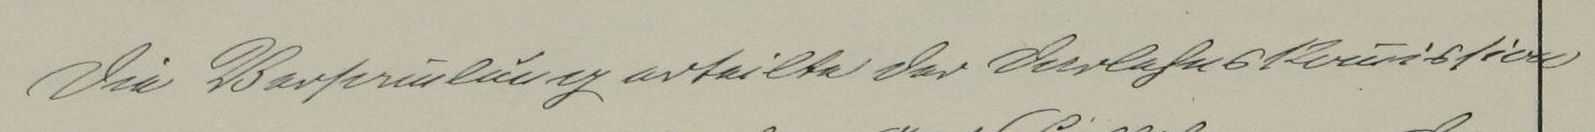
Die Versammlung erteilte der Darlehnskommission
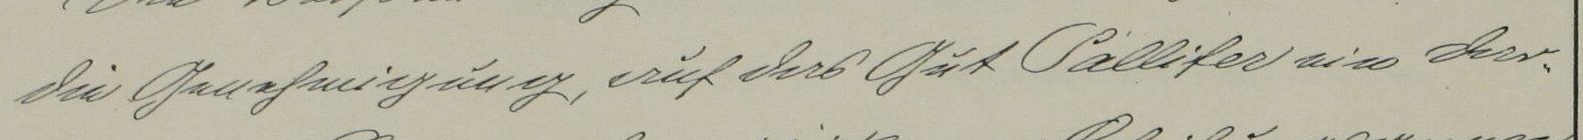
die Genehmigung, auf das Gut Pallifer ein Dar-
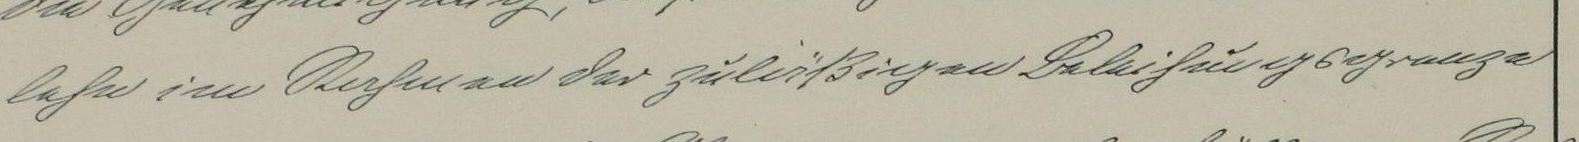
lehn im Rahmen der zuläßigen Beleihungsgrenze
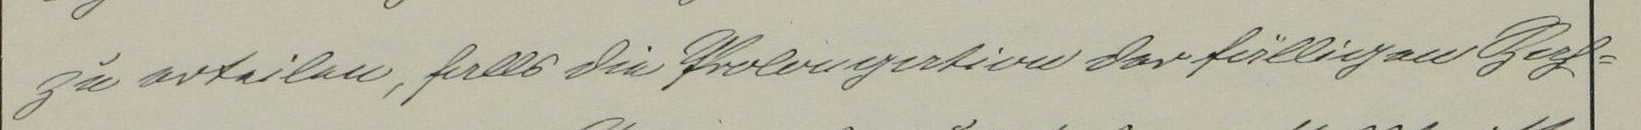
zu erteilen, falls die Prolongation der fälligen Zah-
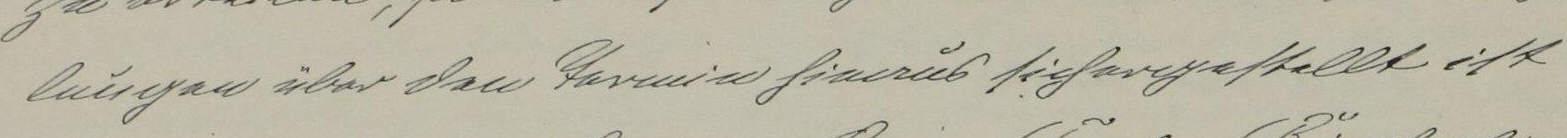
lungen über den Termin hinaus sichergestellt ist
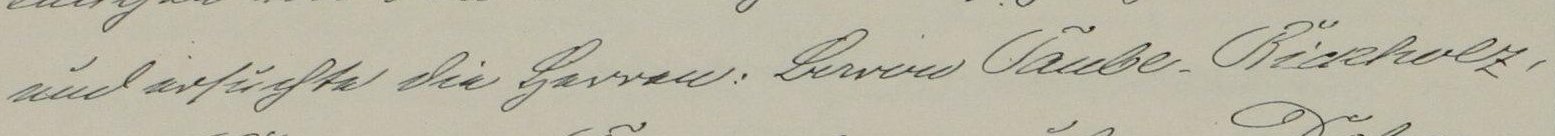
und ersuchte die Herren: Baron Taube-Rickholz,
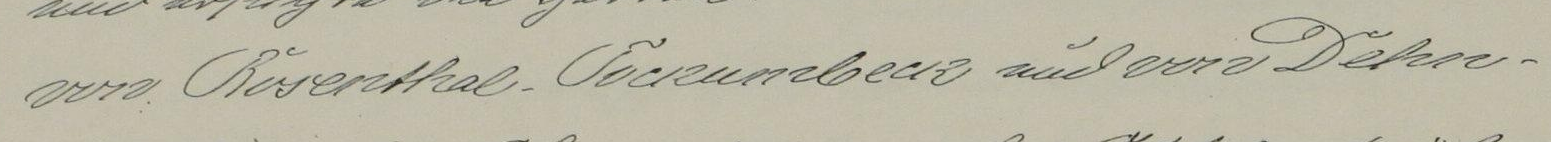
von Rosenthal-Tockumbeck und von Dehn-
